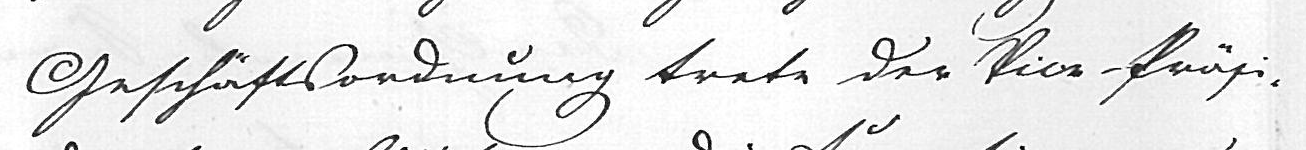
Geschäftsordnung trete der Vice-Präsi-
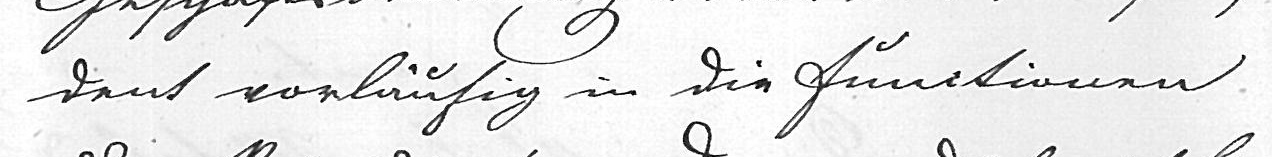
dent vorläufig in die Functionen
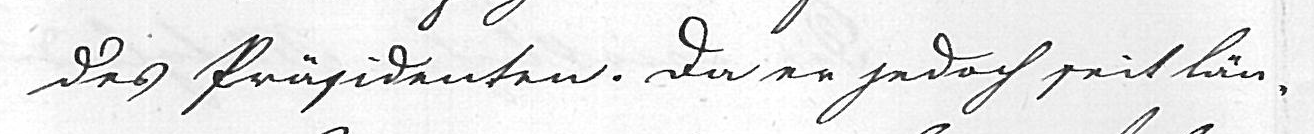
des Präsidenten. Da er jedoch seit län-
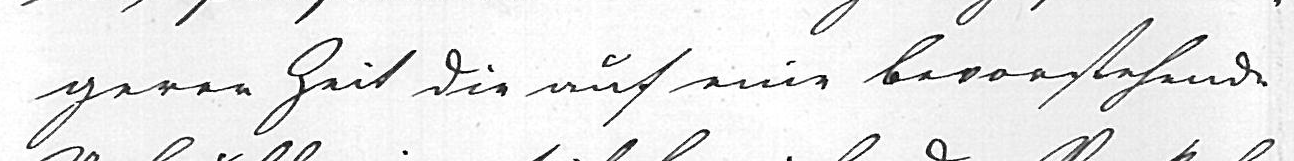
gerer Zeit die auf eine bevorstehende
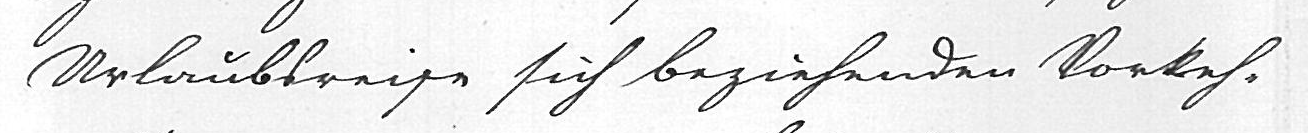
Urlaubsreise sich beziehende Vorkeh-
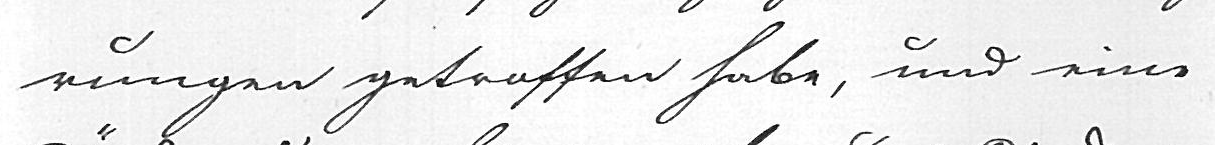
rungen getroffen habe, und eine
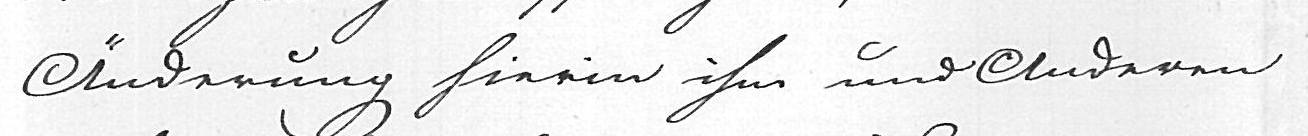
Änderung hierin ihm und Anderen
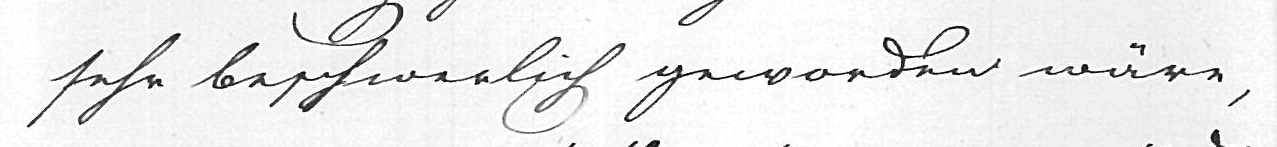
sehr beschwerlich geworden wäre,
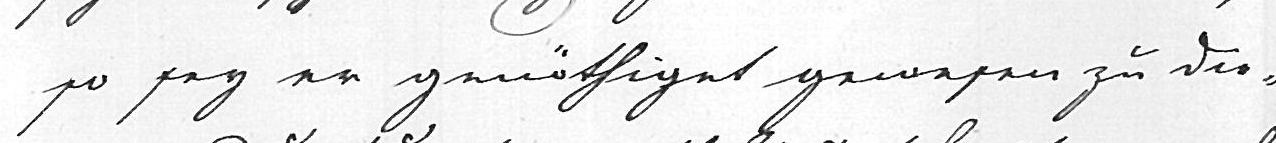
so sey er genöthiget gewesen zu die-
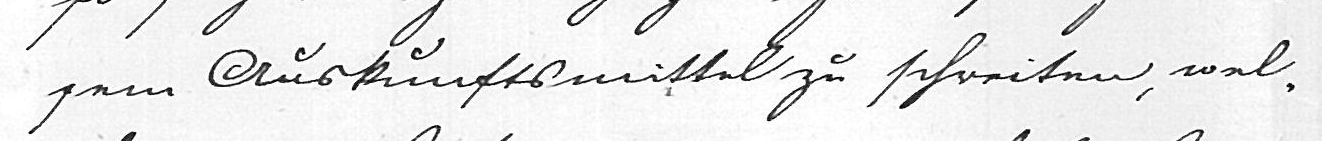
sem Auskunftsmittel zu schreiten, wel-
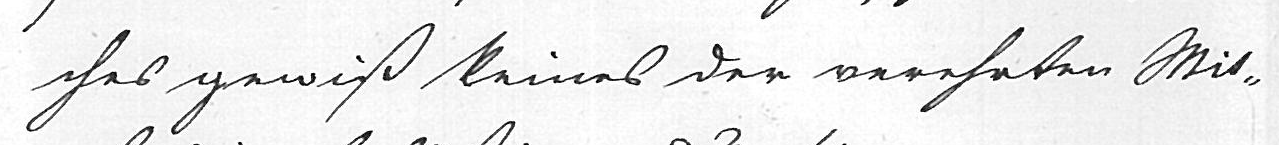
ches gewiß keines der verehrten Mit-
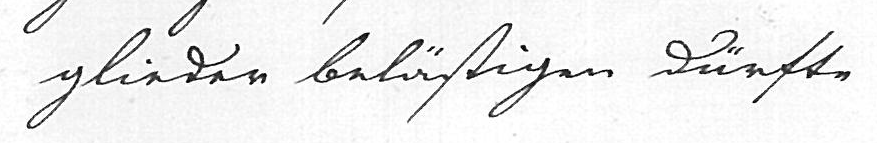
glieder belästigen dürfte.
